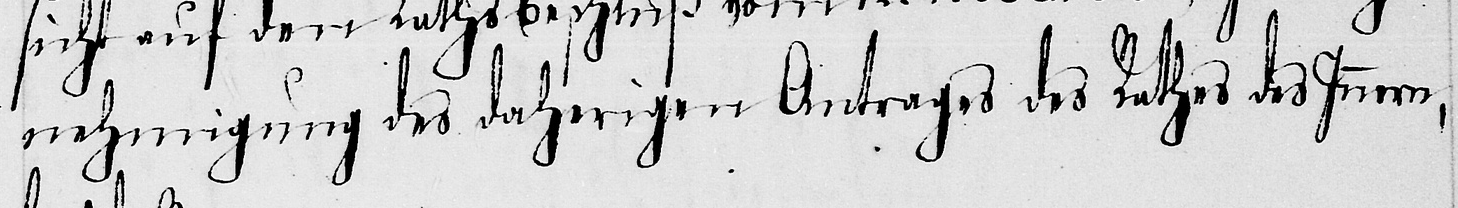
nehmigung des daherigen Antrages des Rathes des Inner¬
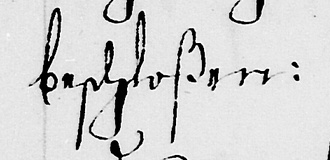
beschloßen:
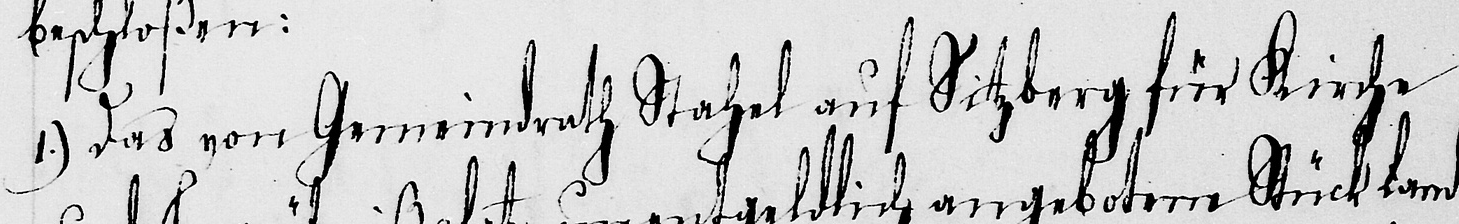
1.) Das von Gemeindrath Stahel auf Sitzberg für Kirche
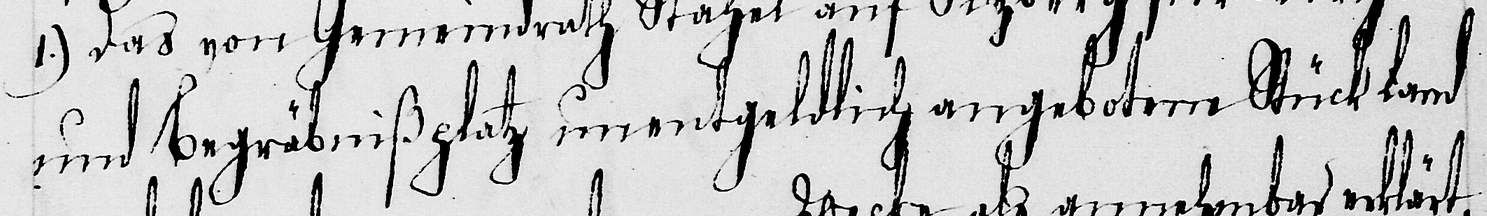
und Begräbnißplatz unentgeldlich angebotene Stück Land
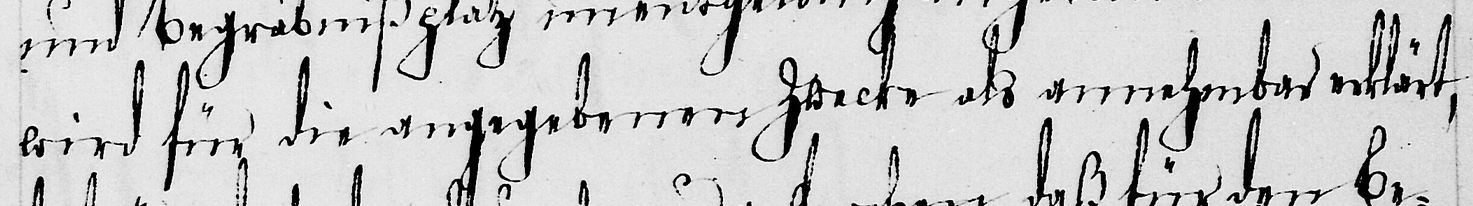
wird für die angegebenen Zwecke als annehmbar erklärt,
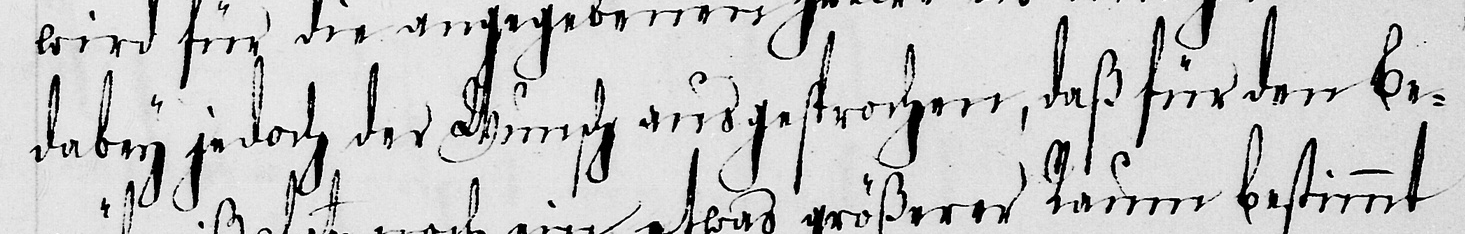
dabey jedoch der Wunsch ausgesprochen, daß für den Be¬
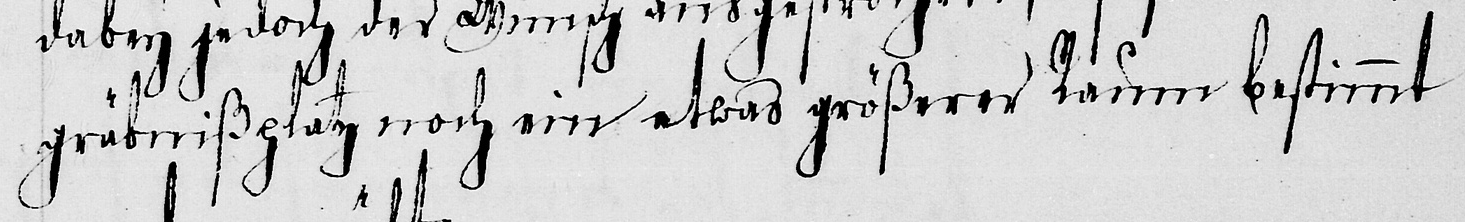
gräbnisplatz noch ein etwas größerer Raum bestimmt
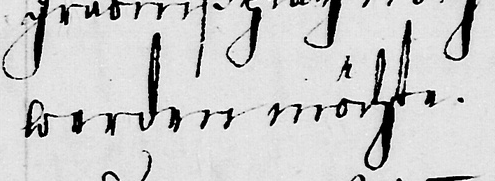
werden möchte.
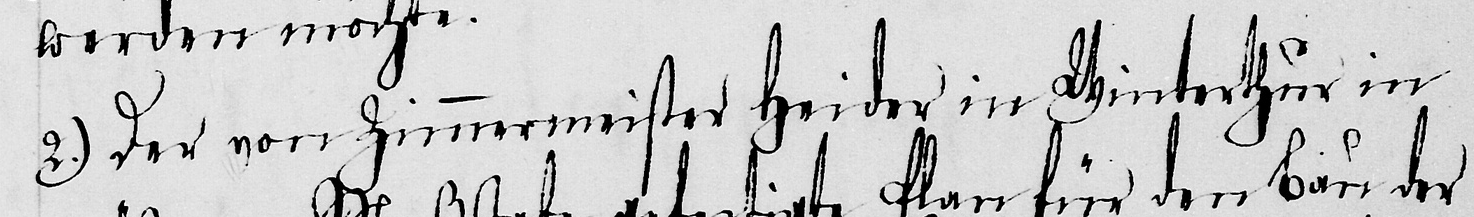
2.) Der von Zimmermeister Heider in Winterthur in
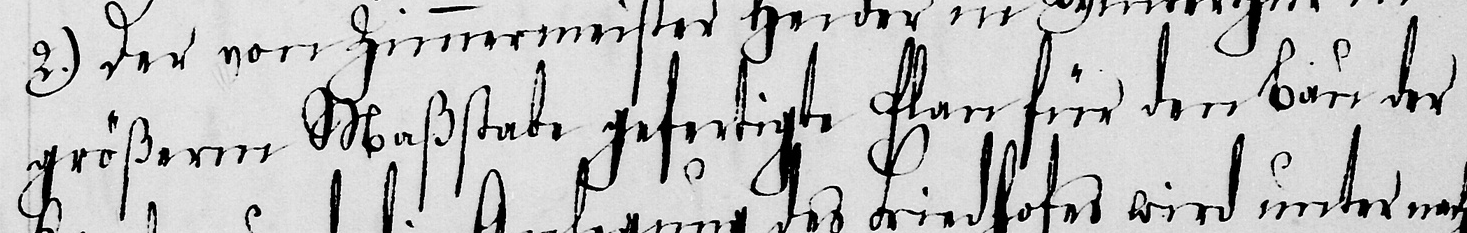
größerm Maßstabe gefertigte Plan für den Bau der
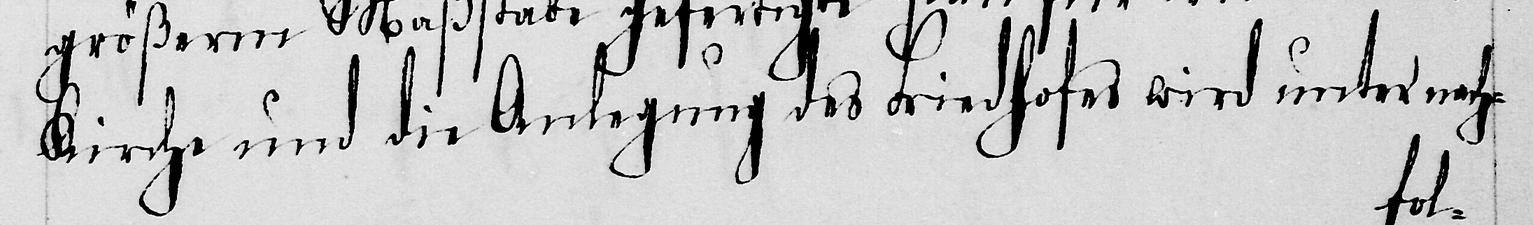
Kirche und die Anlegung des Friedhofes wird unter nach-
